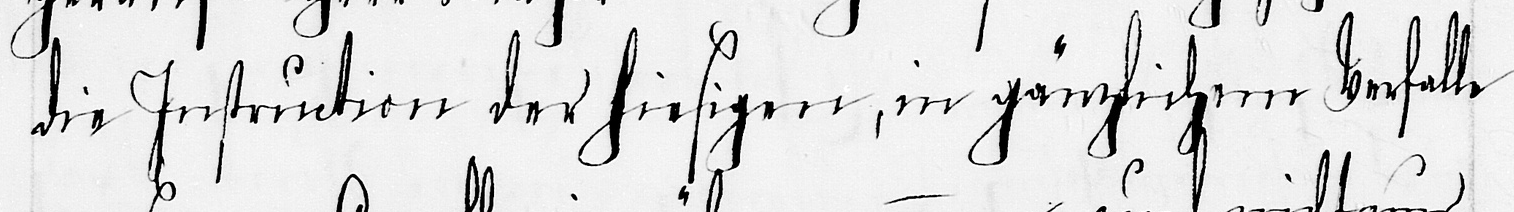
die Instruction der hiesigen, in gänzlichem Verfal¬
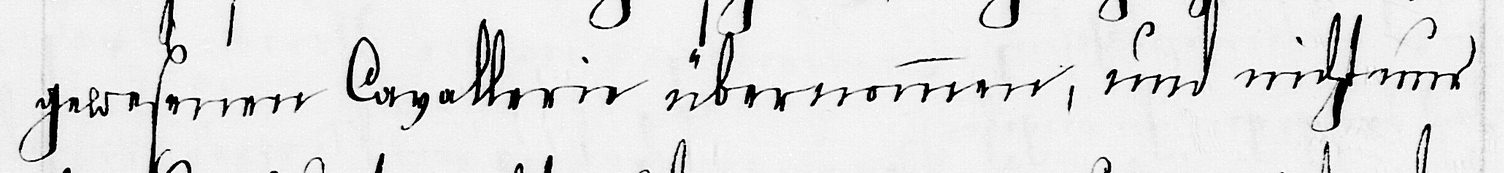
gewesenen Cavallerie übernommen, und nicht nur
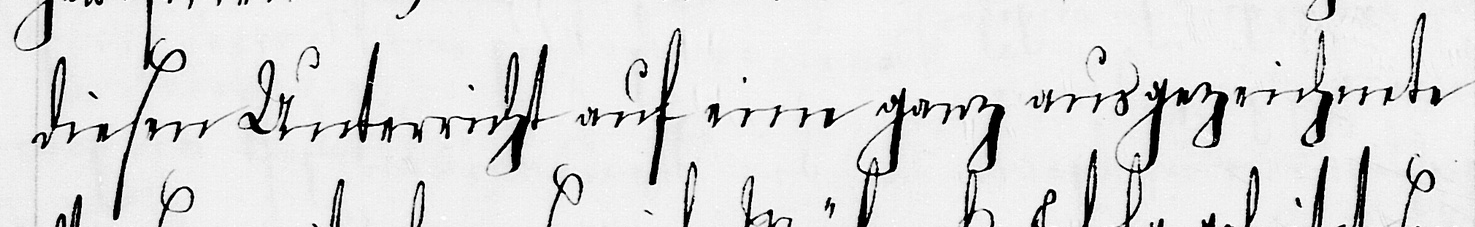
diesen Unterricht auf eine ganz ausgezeichnete
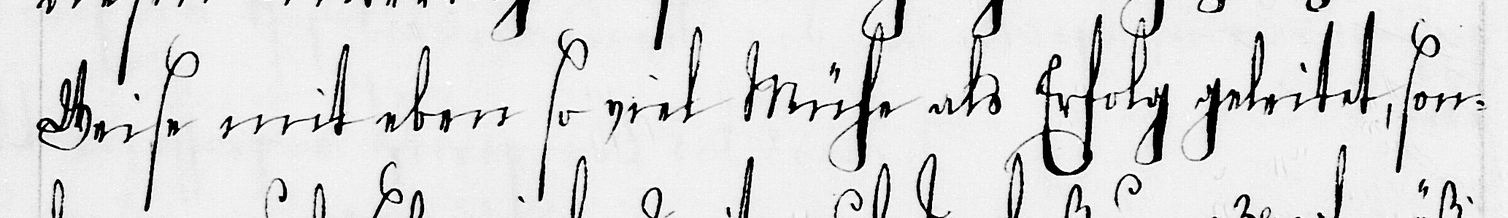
Weise mit eben so viel Mühe als Erfolg geleitet, so¬
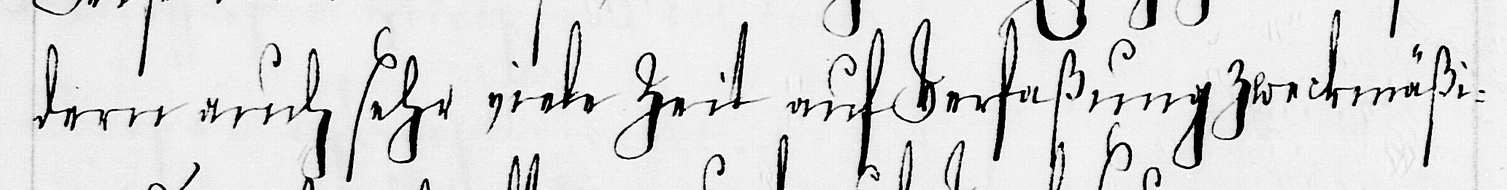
ndern auch sehr viele Zeit auf Verfaßung zweckmäßi¬
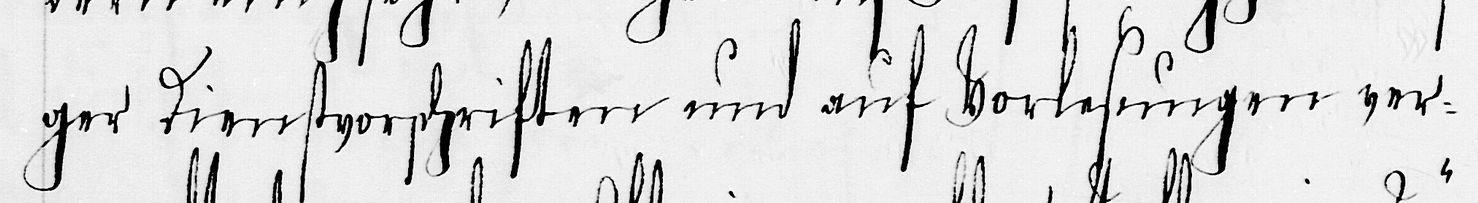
ger Dienstvorschriften und auf Vorlesungen ver¬
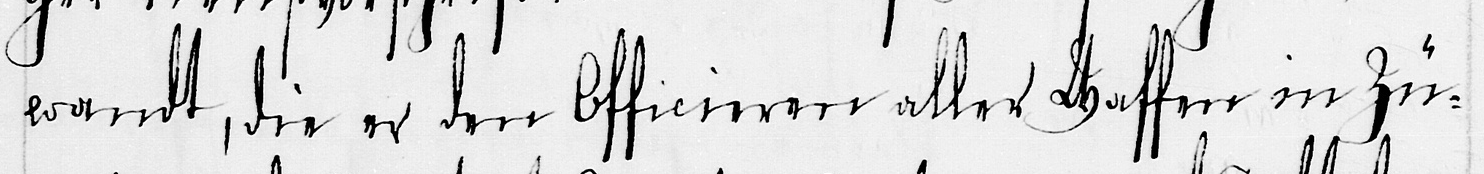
wandt, die er den Officieren aller Waffen in Zü¬
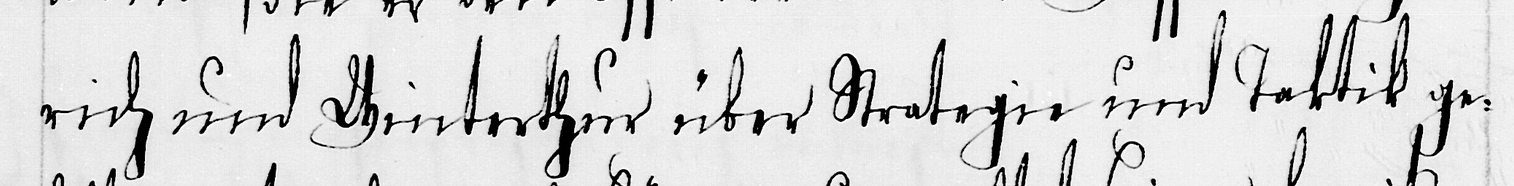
rich und Winterthur über Strategie und Taktik ge¬
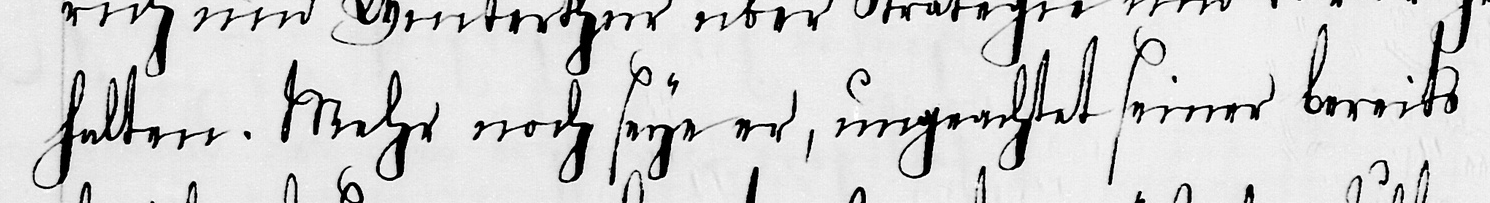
halten. Mehr noch seye er, ungeachtet seiner bereits
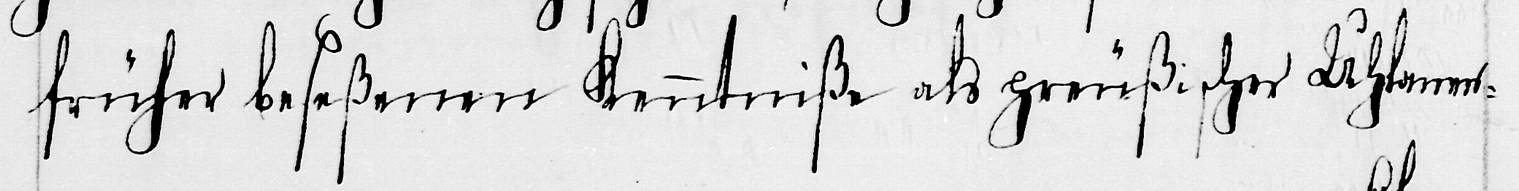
früher beseßenen Kenntniße als preußischer Uhlanen-
